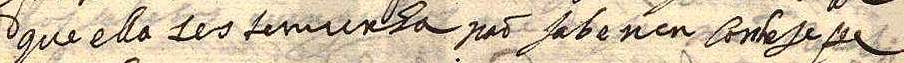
que ella testemunha naõ sabe nem conhese pe
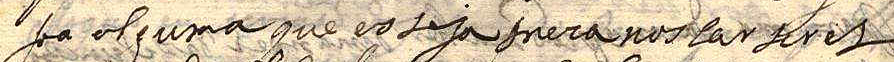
soa alguma que esteja preza nos carseres
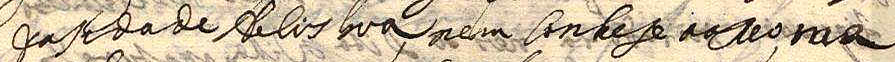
da sidade De lisboa, nem conhese ao Reo, ma
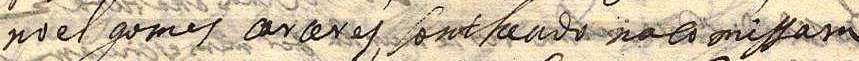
noel gomes carceres, Contheudo na comissam
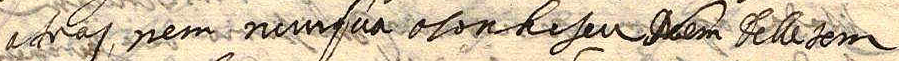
atras, nem nunqua o conheseu Nem Delle tem
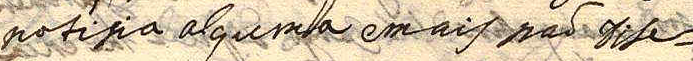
notisia alguma e mais naõ Dise
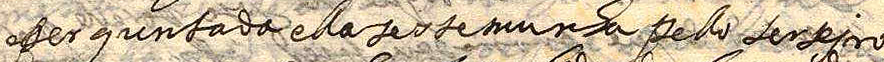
e perguntada ella testemunha pello terseiro
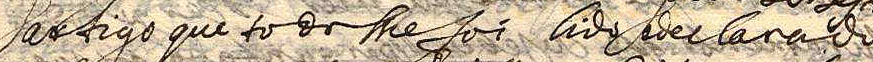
artigo que todo lhe foi lido e declarado
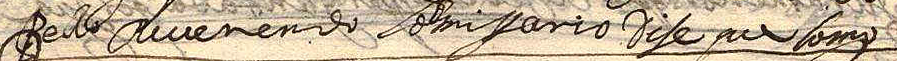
pello Reuerendo Comissario Disse que Como
